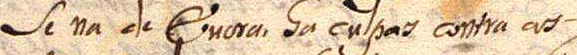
se na de Euora ha culpas contra as
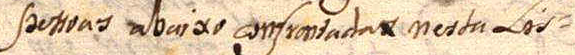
pessoas abaixo confrontadas nesta Lis
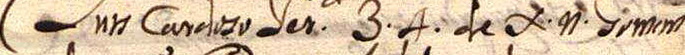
Luis Cardozo Per.a 3.4. de x. n. homem
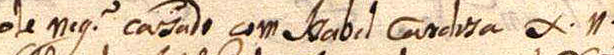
de neg.o casado com Isabel Cardosa x. n.
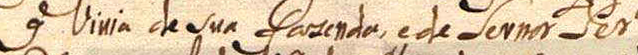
q̄ Viuia de sua fazenda, e de Leonor Pera.
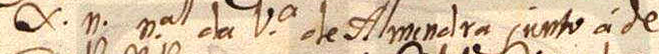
X. n. n.al da V.a de Almendra junto á de
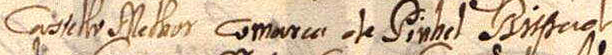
Castello Melhor Comarca de Pinhel Bispado
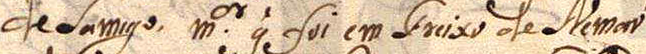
de Lamego. m.or q̄ foi em Freixo de Nemaõ
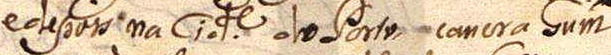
e depois na Cid̄.e do Porto, e auera hum
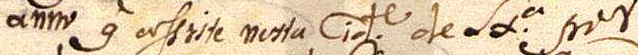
anno q̄ assiste nesta Cid̄. de Lx.a por
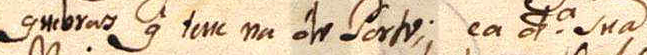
quebras q̄ teue na do Porto; e a d̄.a sua
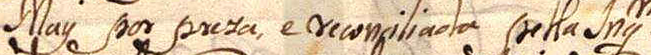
May por preza e reconciliada pella Inq.m
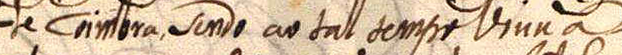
de Coimbra sendo ao tal tempo Viuua
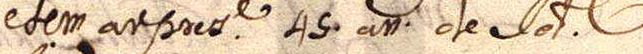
e tem ao prez.e 45 an. de Id̄.e
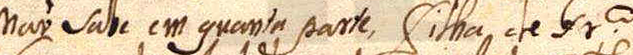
naõ sabe em quanta parte, filha de Fr.co
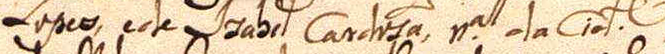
Lopes, e de Izabel Cardosa, n.al da Cid̄.e
